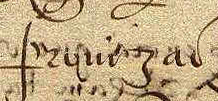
prouizaõ
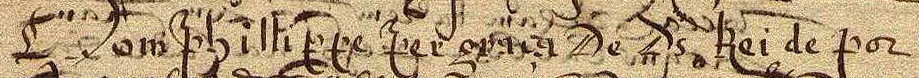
Dom phillippe per graça De Ds̄ Rei de por
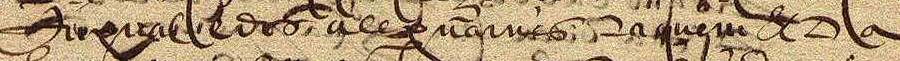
tugual e dos allguarues daquem & Da
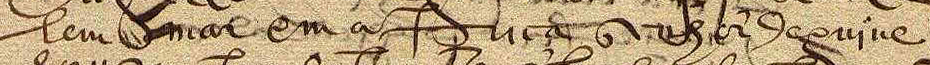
lem mar em africa senhor de gujne
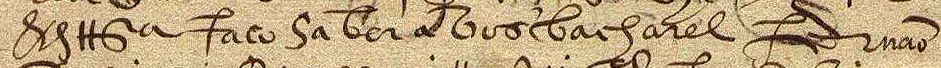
&ꝭttra faço Saber a Vos bacharel fernão
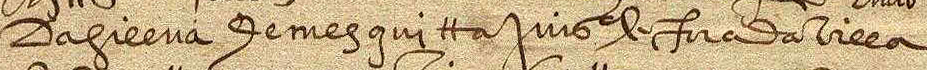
Da sillua de mesquitta Juis de fora da Villa
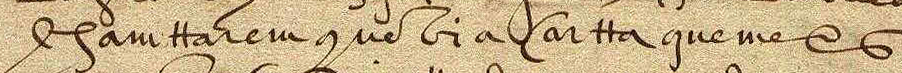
de samttarem que Vi a Cartta que me es
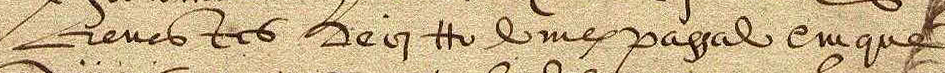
Creuestes De ojtto do mes passado em que
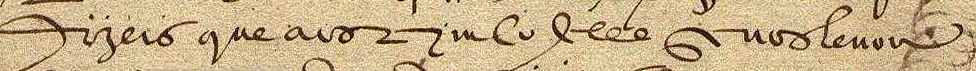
dizeis que aos cjmco delle se uos leuou
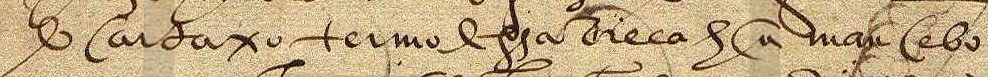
do Cartaxo termo dessa Villa hū manCebo
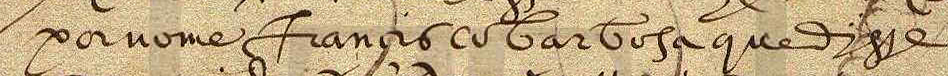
por nome francisco barbosa que djsse
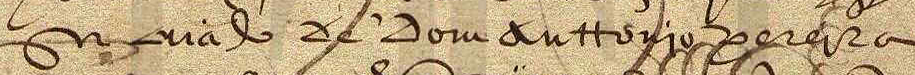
ser criado De Dom Anttonjo perejra
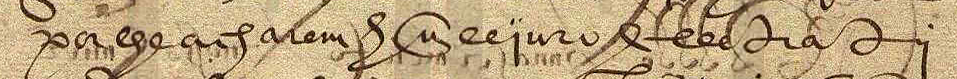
por lhe acharem hū lljuro de lletra ty
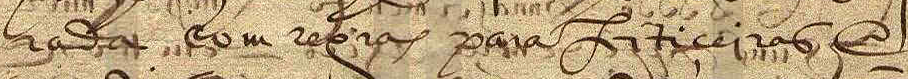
rada com regras para feiticejras e
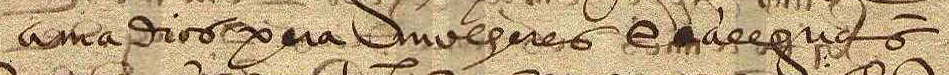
amadios pera molheres e allguas̄
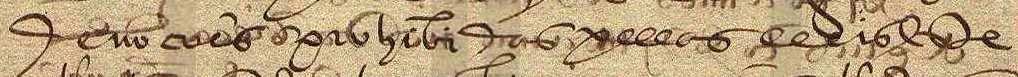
deuoçoẽs prohibidas pellas lleis deste
